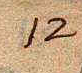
12
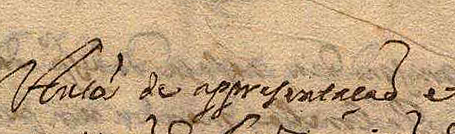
Autos de appresentaçaõ &
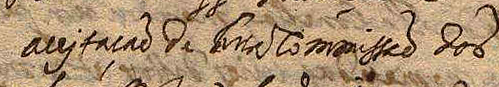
acejtaçaõ de huā commissaõ dos
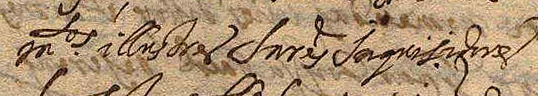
mtos. illustres Snres̄ Inquisidores
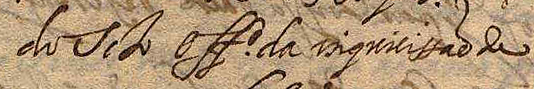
do Scto offo. da inquicissaõ de
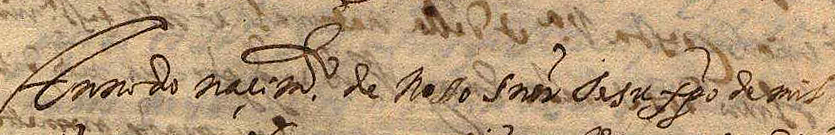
Anno do nacim.to de nosso snor̄ Iesu xp̄o de mil
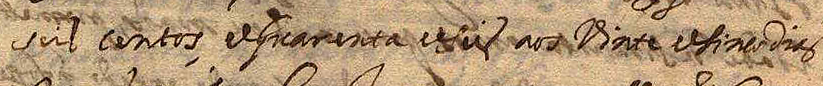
seiscentos, e quarenta e seis aos Vinte e sinco dias
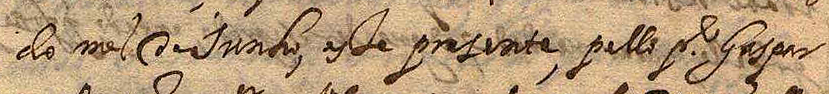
do mes de Iunho, este prezente, pello p.e Gaspar
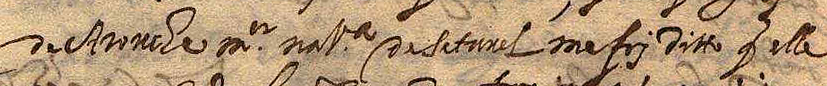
de Arouche m.or na V.a de setuuel me foj ditto q̄ elle
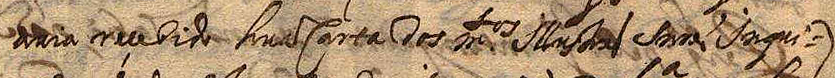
auia recebido huā Carta dos m.tos Illustres Snres̄ Inqui
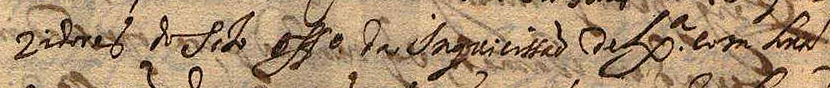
zidores do Sc̄to offo da Inquicissaõ de Lx.a com huā
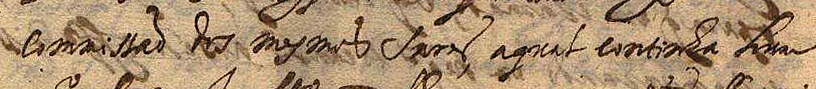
commissaõ dos mesmos Snres̄, a qual continha huū
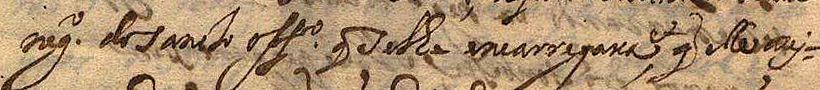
neg.o do Sancto offo. q̄ se lhe encarregaua, & q̄ elle acej
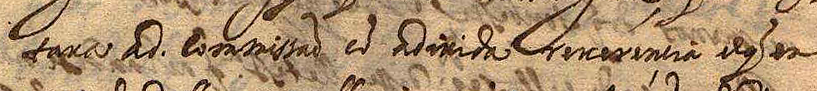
taua a d. commissaõ cō a diuida e reuerencia e q̄ en
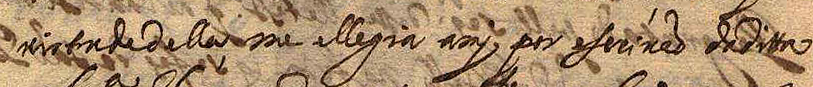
uirtude della me ellegia a mj por escriuaõ da ditta
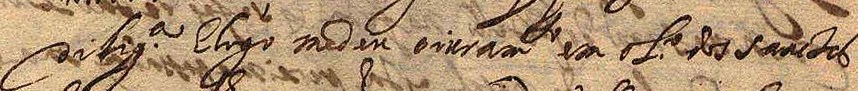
dilig.a E logo me deu o iuramto em o L.o dos sanctos
